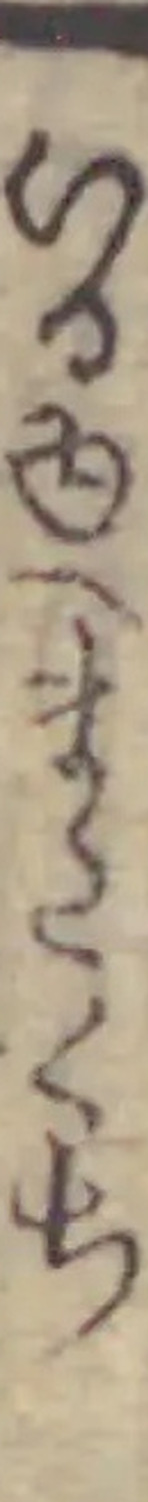いるゆへまたくち
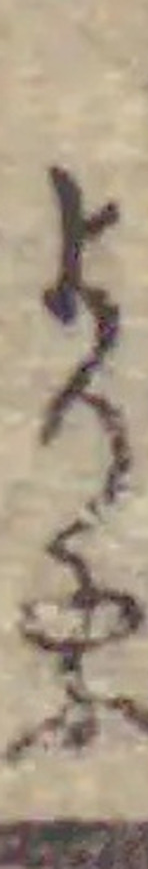よりやぶ
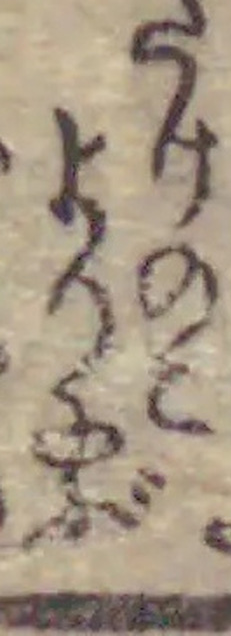よりやぶ
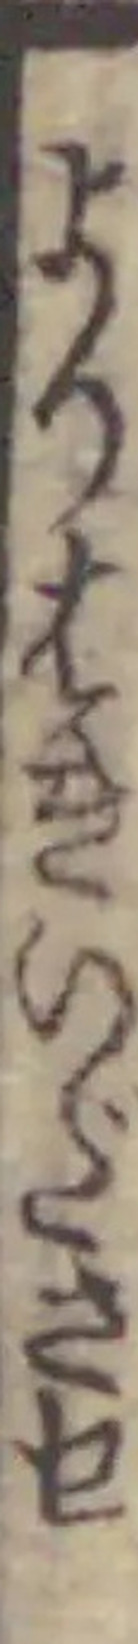よりはきいださせ
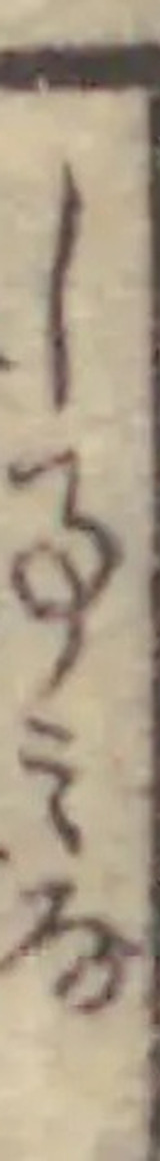し事みな
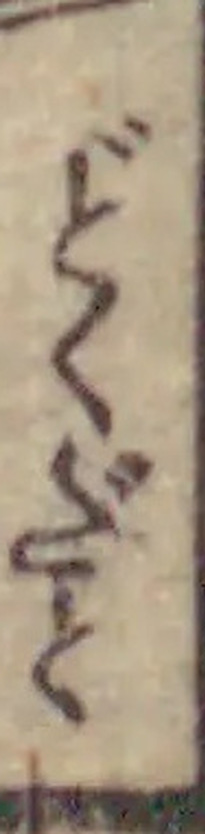どくだと
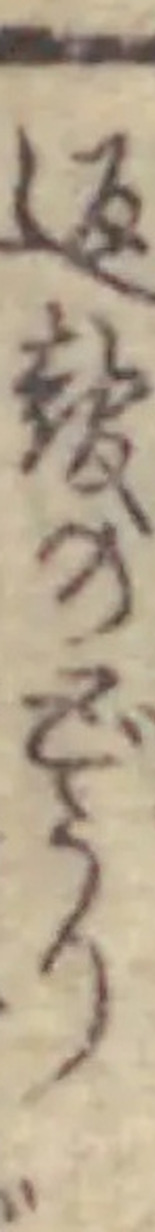返報のどうり
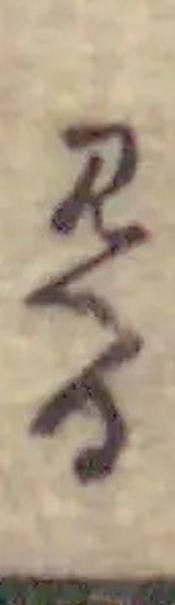見へる
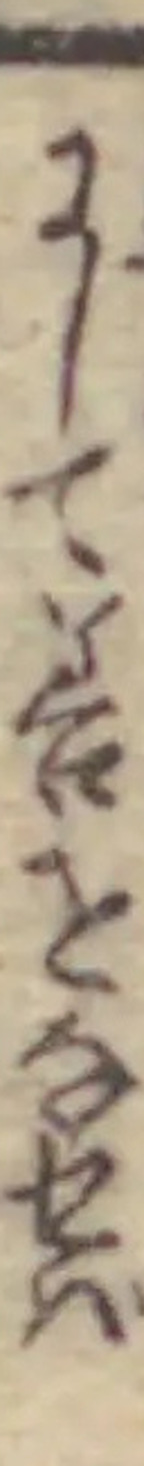にして善をなせば
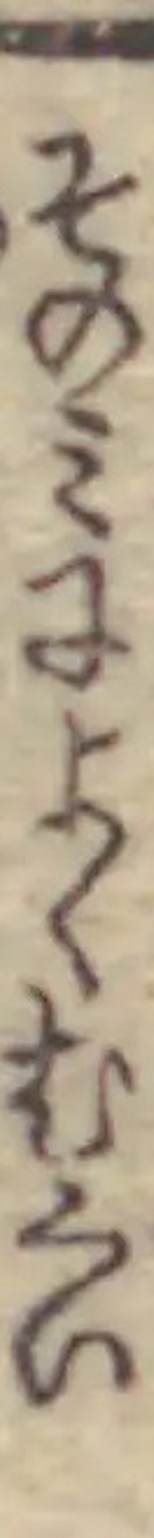そのみによくむくい
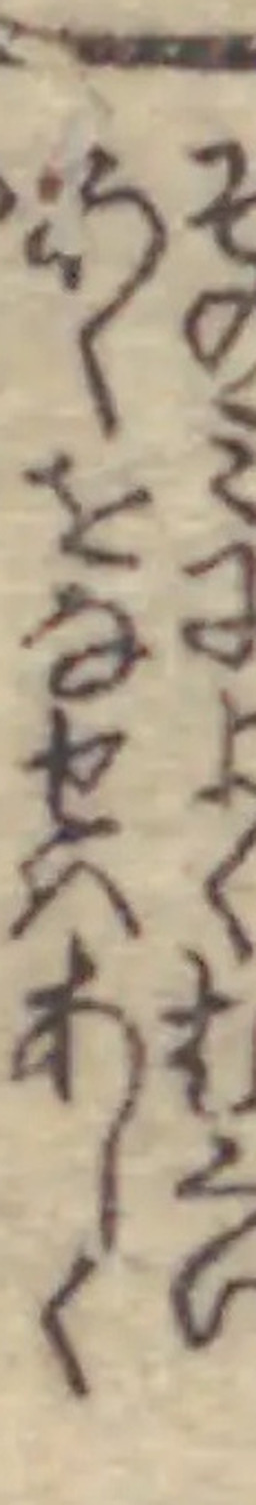あくをなせはあしく
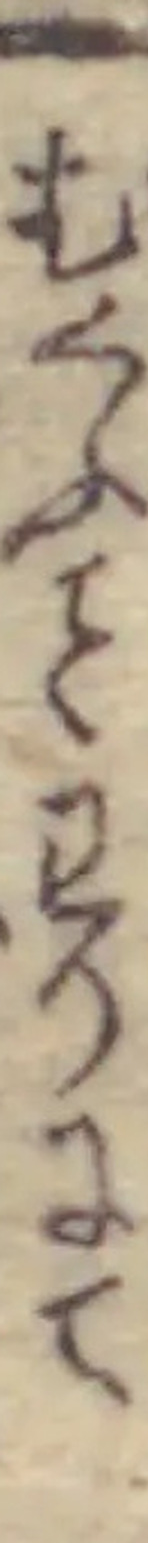むくふことわりにて
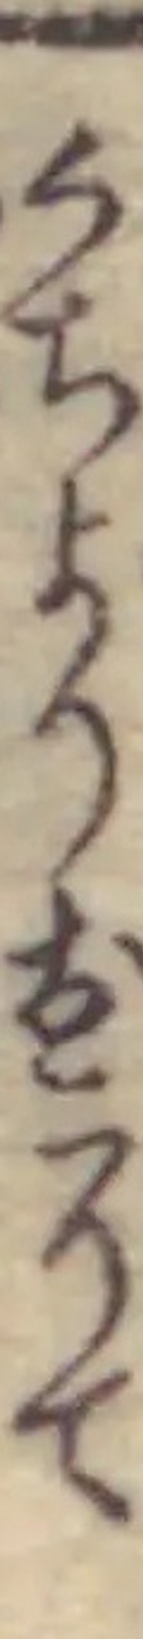くちよりおこりて
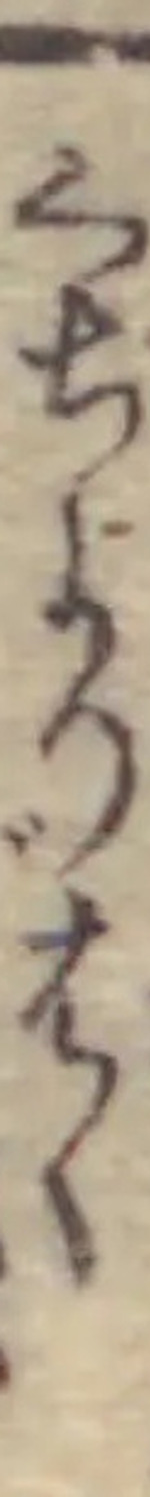くちよりはく
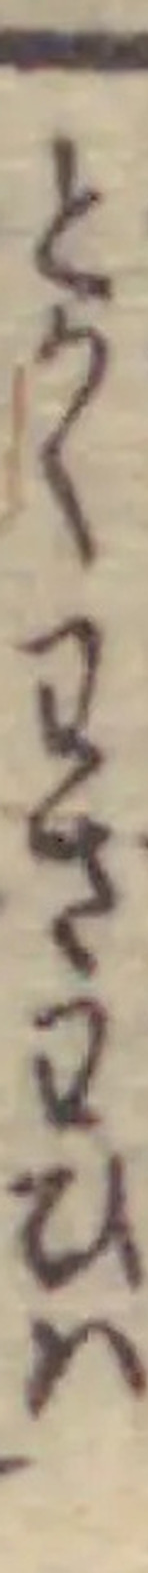とかくわざわひは
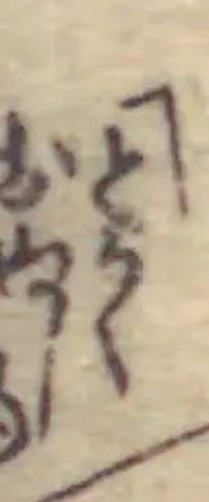〽とかく
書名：腹内養生主論 3巻
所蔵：国立国会図書館 National Diet Library, JAPAN
